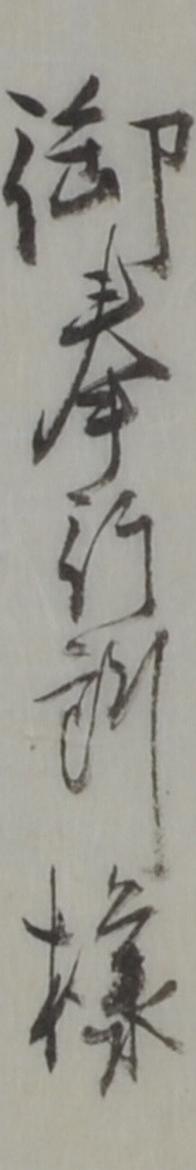御奉行所様
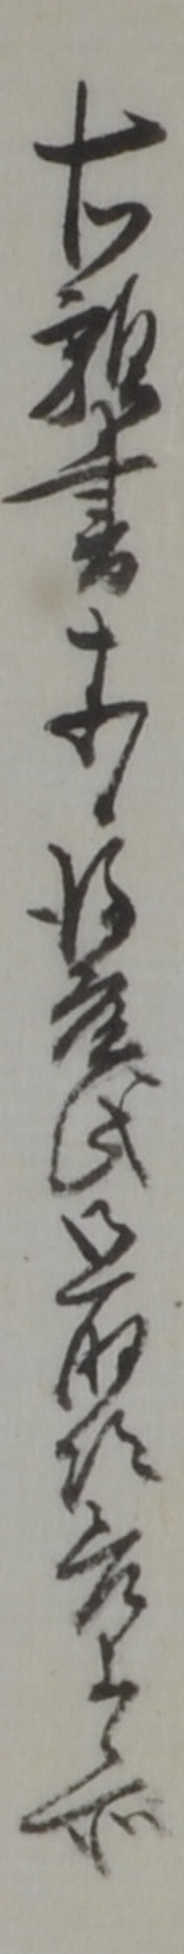右願書十五日後藤氏御取次差上候所
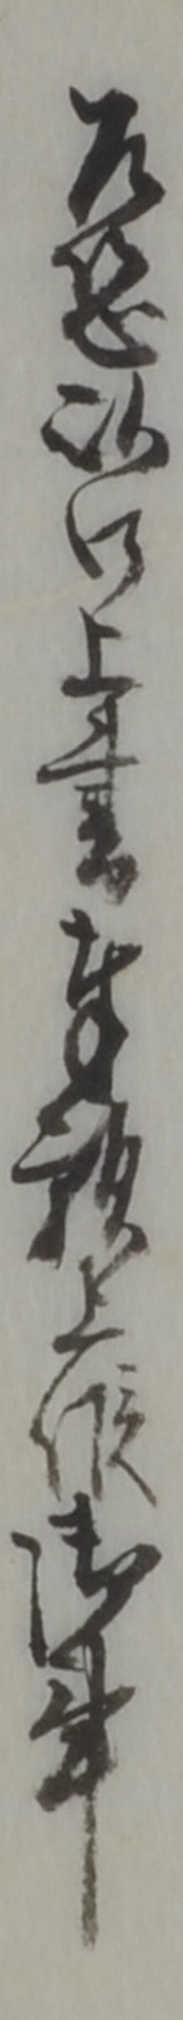乍恐以口上書奉願上候御事
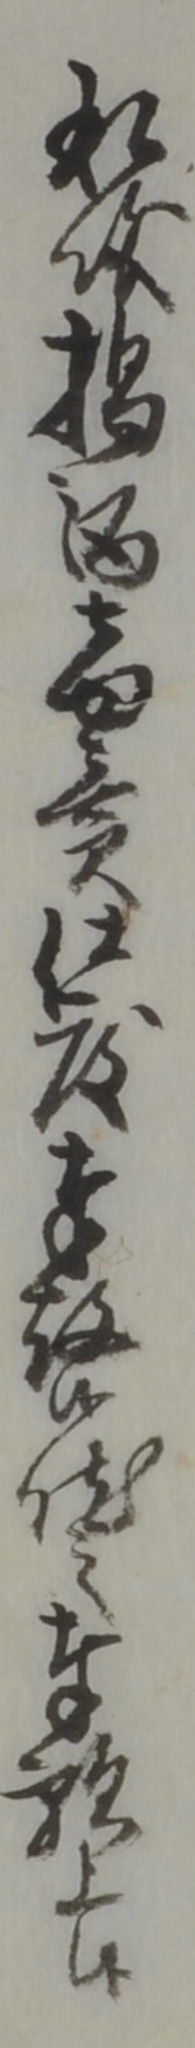私儀揚酒商売仕度奉存候依之奉願上候
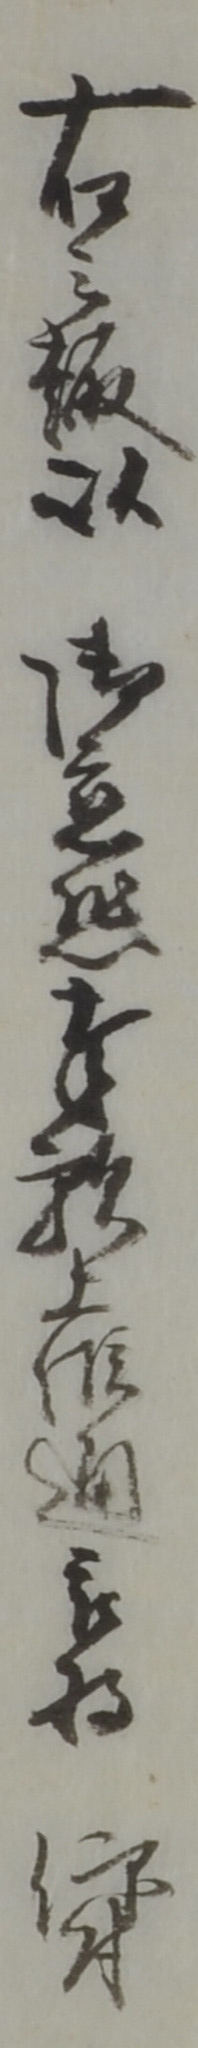右之趣以御慈悲奉願上候通被為仰付
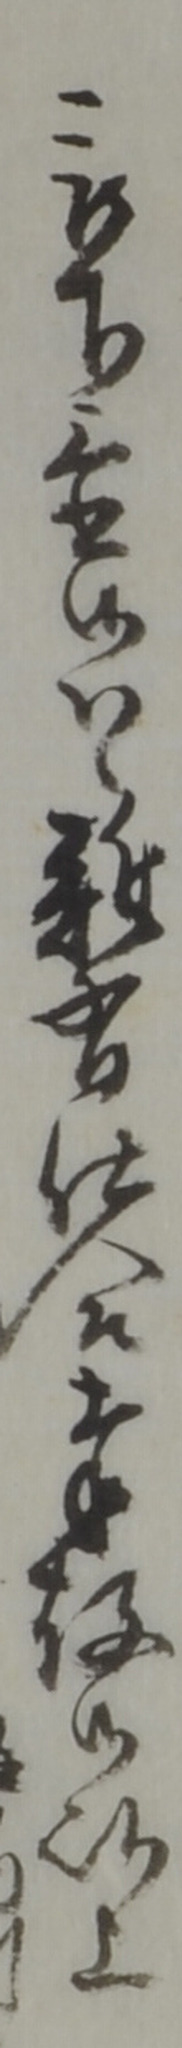被下置候ハヽ難有仕合奉存候以上
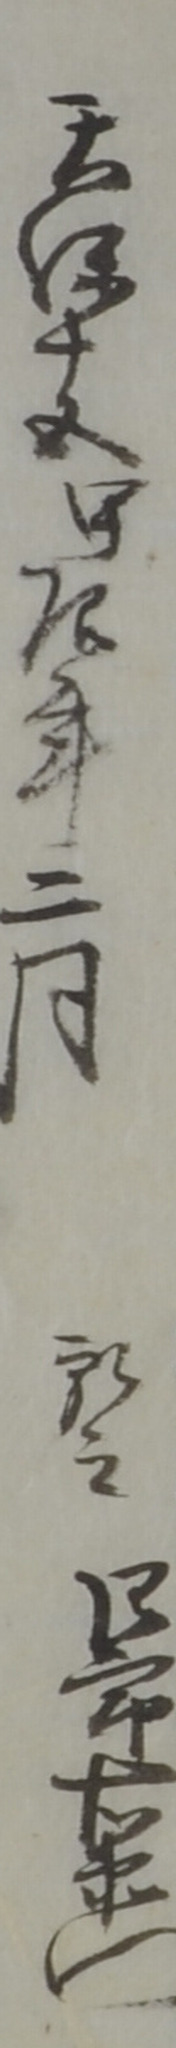天保十五甲辰年二月願主四郎右衛門
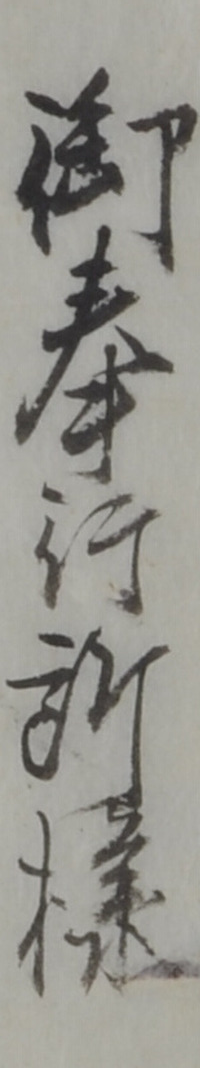御奉行所様
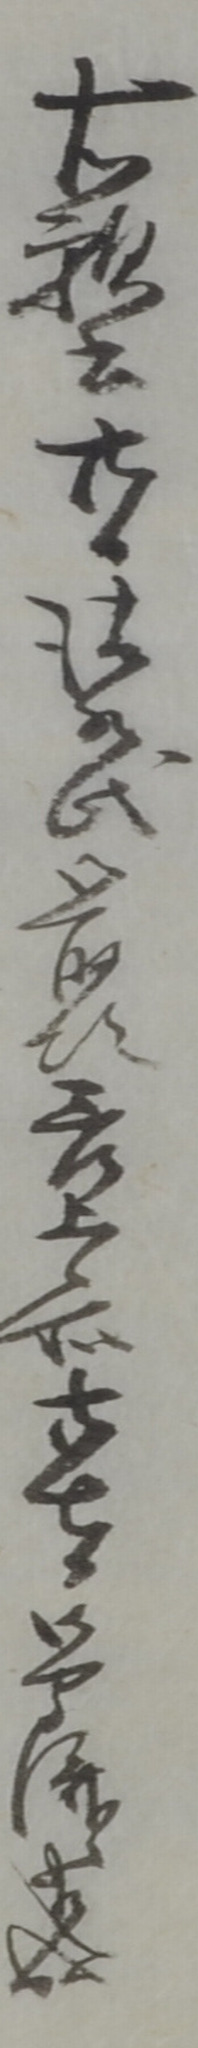右願書廿日清水氏御取次差上候所廿七日御聞済ニ相成
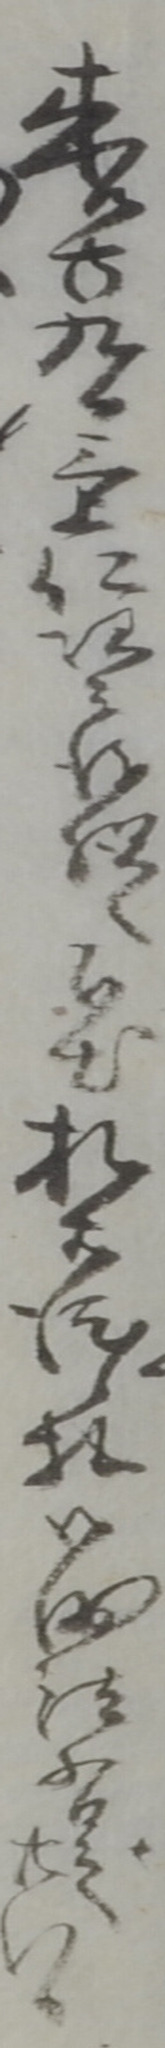来ル廿九日三上仁次兵衛様へ罷出札相渡候様御沙汰有之
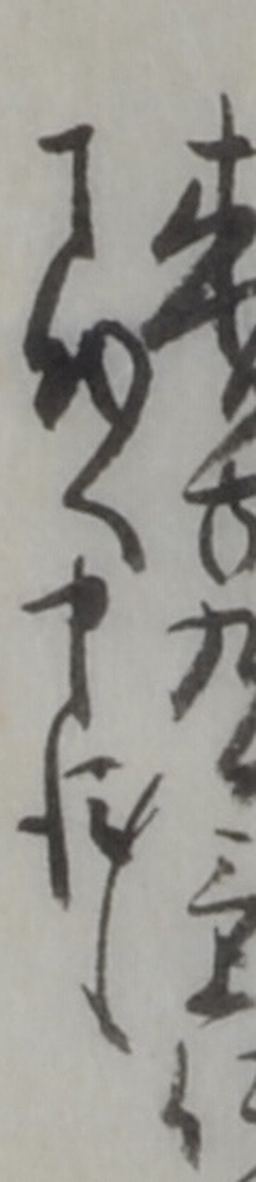丁代へ申渡候

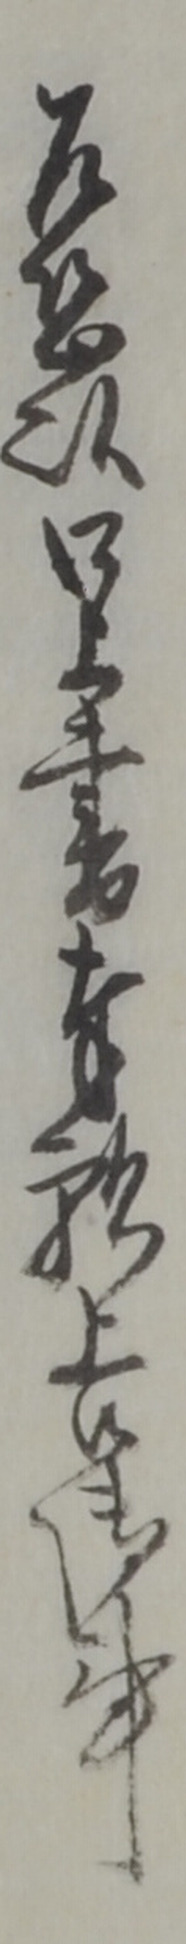乍恐以口上書奉願上候御事
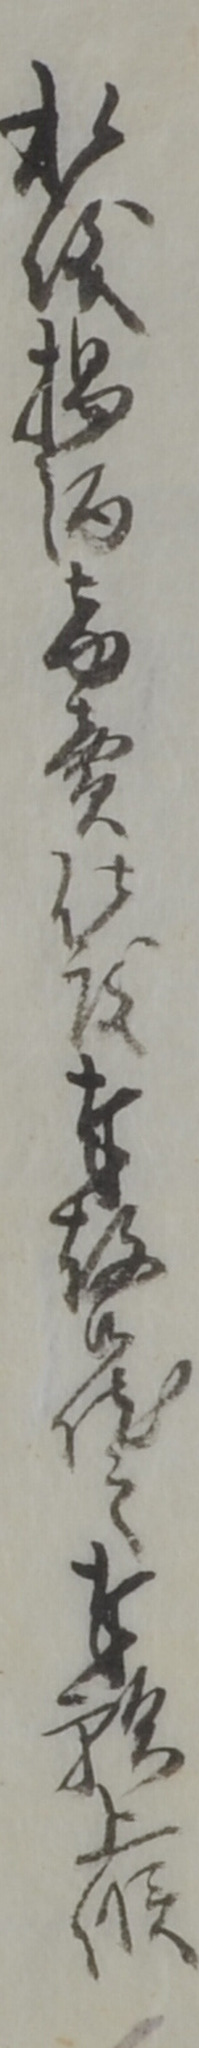私儀揚酒商売仕度奉存候依之奉願上候
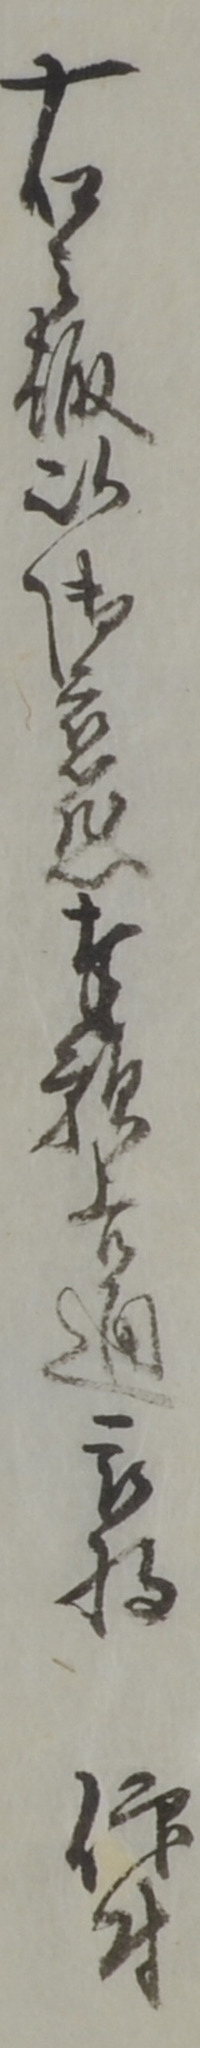右之趣以御慈悲奉願上候通被為仰付
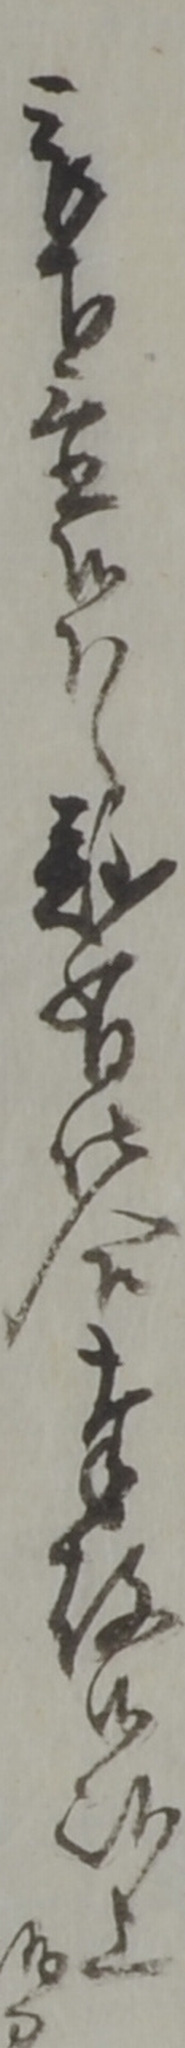被下置候ハヽ難有仕合奉存候以上
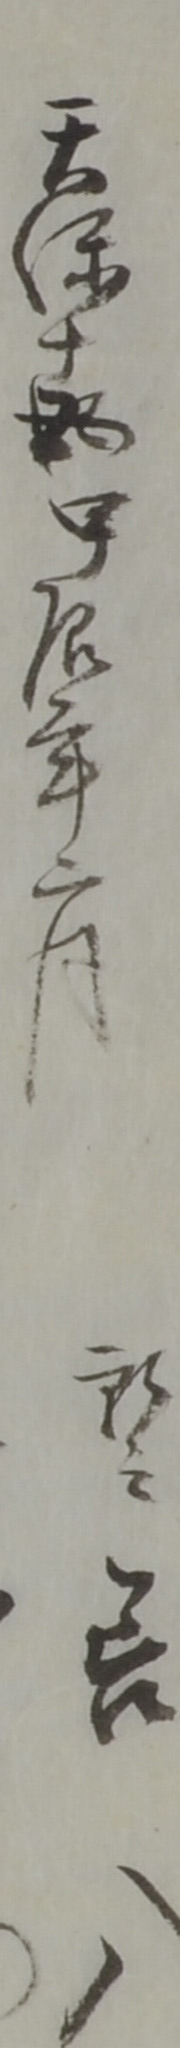天保十五甲辰年二月願主善八
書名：諸願書控簿
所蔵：伊那市立高遠町図書館・合同会社AMANE
